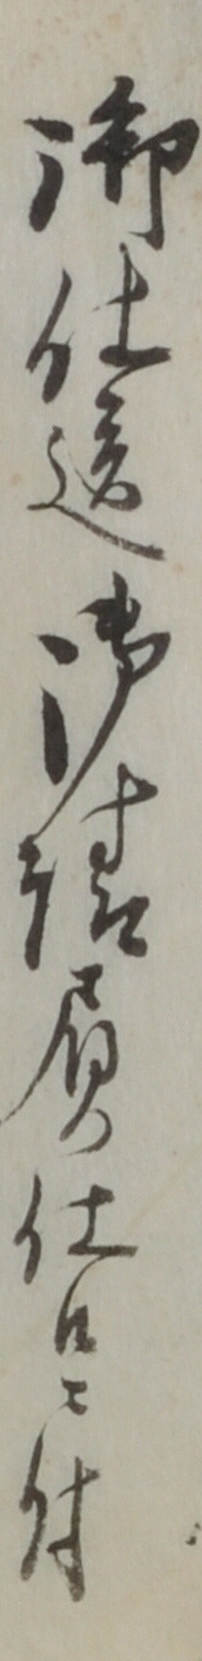御仕送御請負仕候ニ付
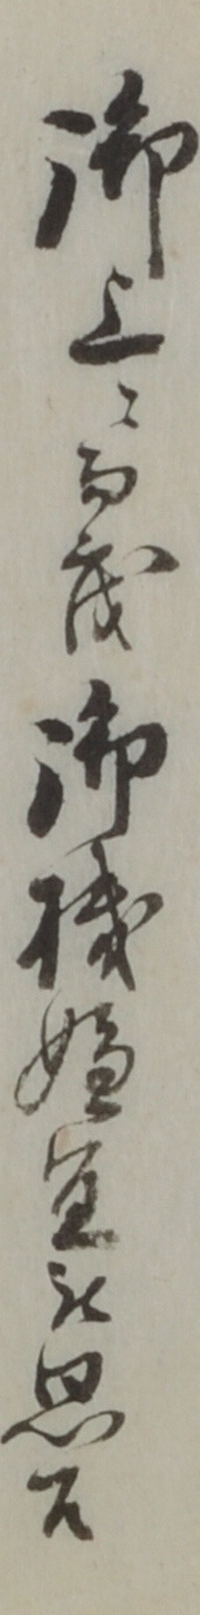御上ニ而も御機嫌宜被思召
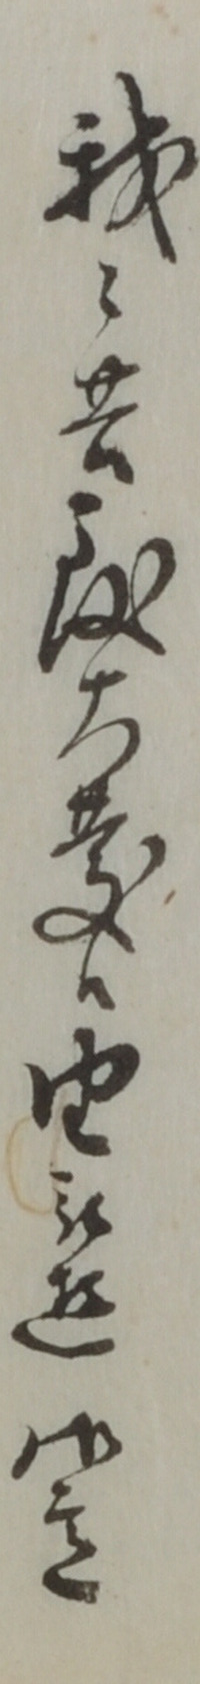我々共致大慶候由被遊御意
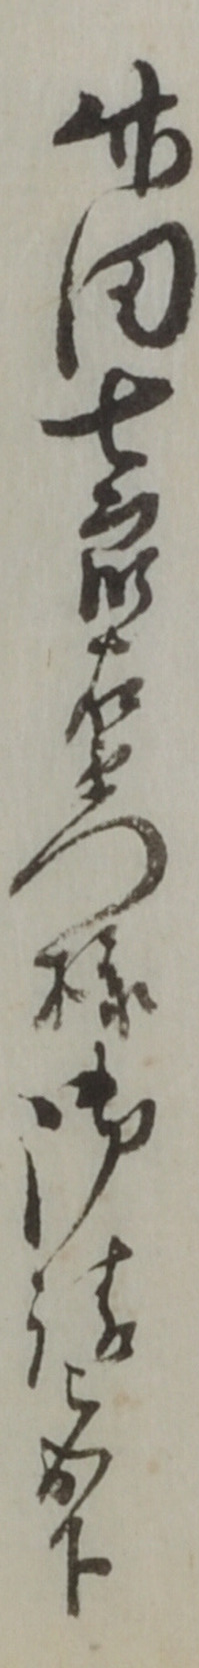竹田七郎右衛門様御請被成下
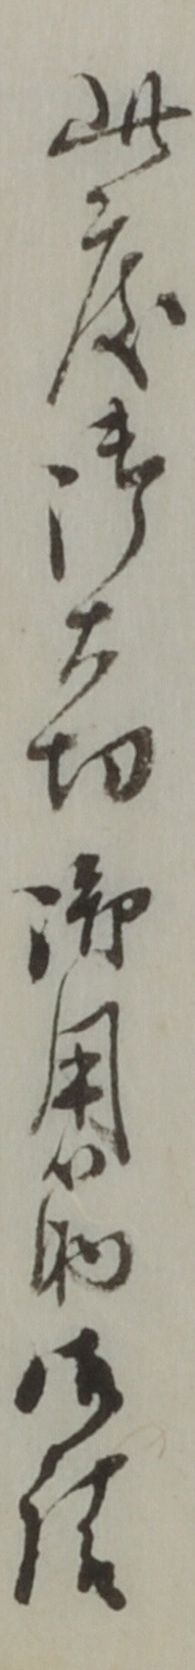此度御大切御用筋御請
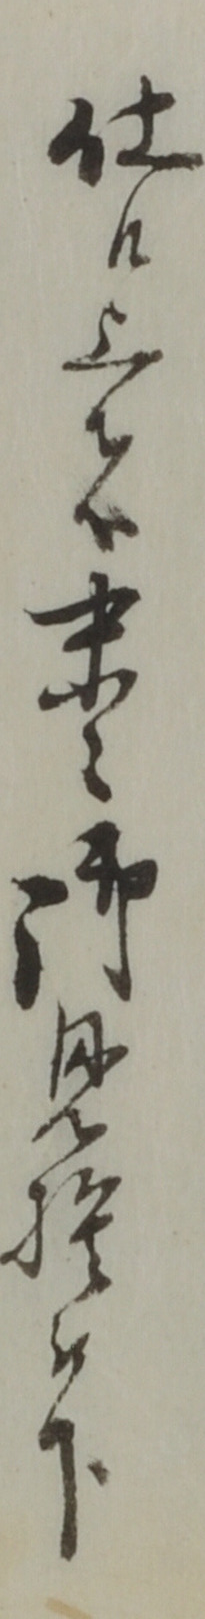仕候上は末々御見捨被下
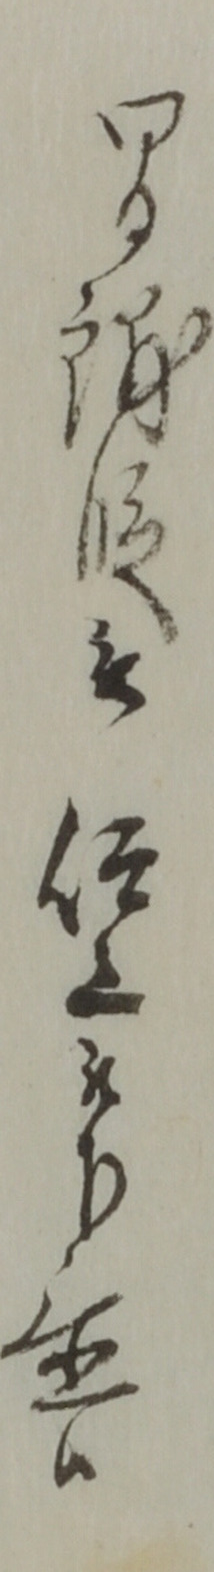間敷段被仰上被下置候
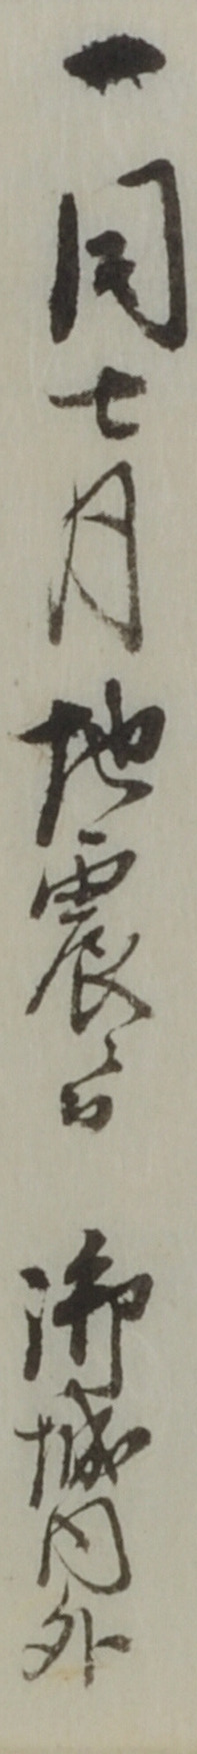一同七月地震ニ而御城内外
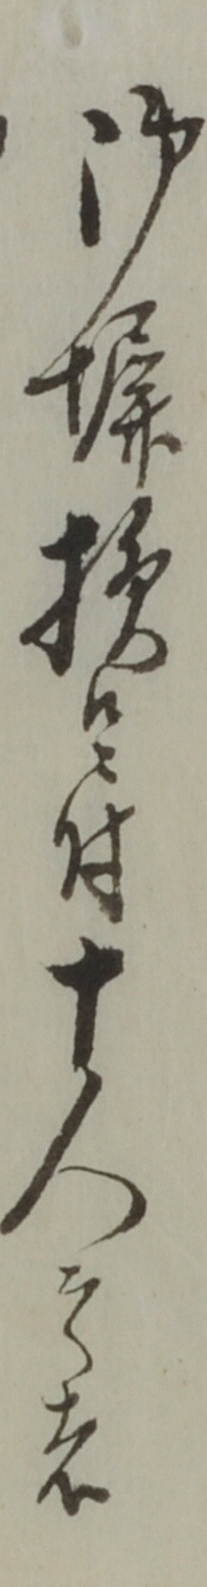御塀損候ニ付十人之者
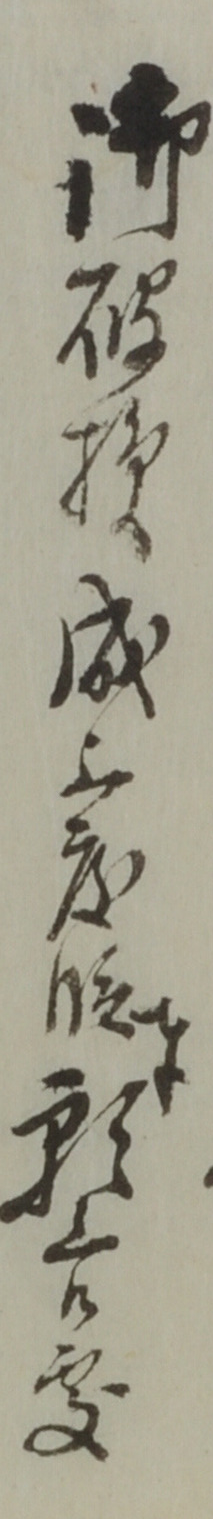御破損成上度段奉願上候処
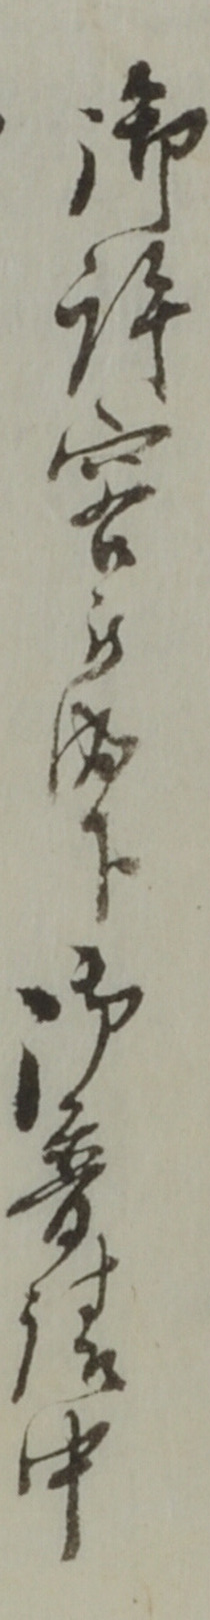御許容被成下御普請中
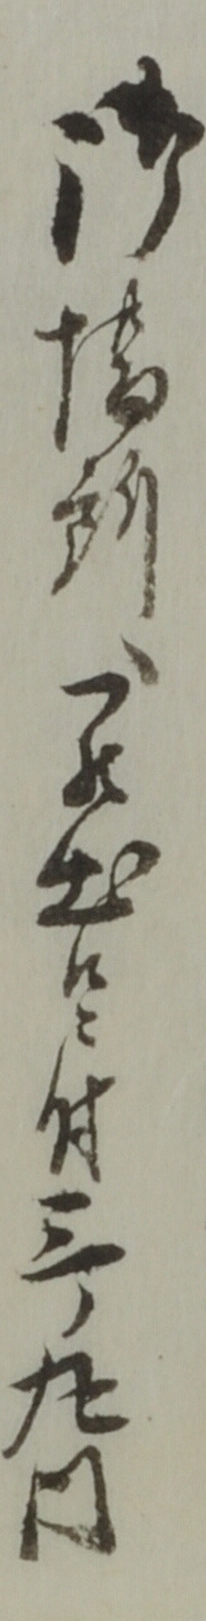御場所へ罷出候ニ付三ノ丸内
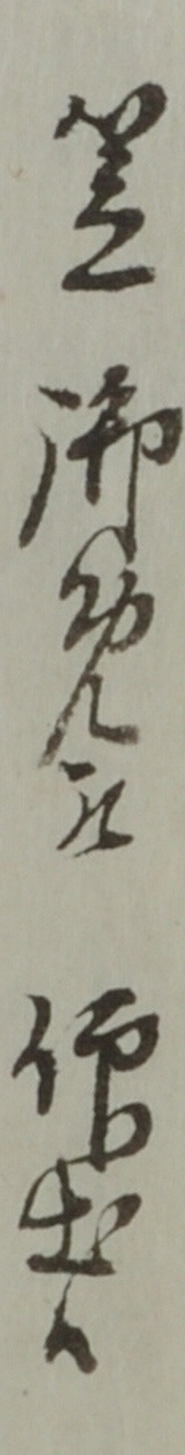笠御免被仰出候
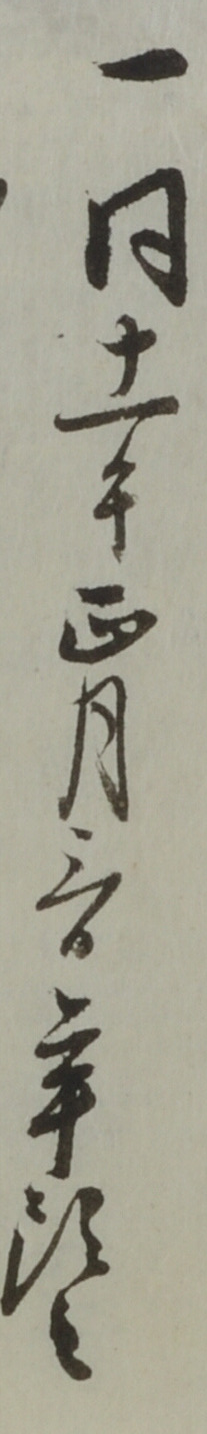一同十一年正月三日年頃之
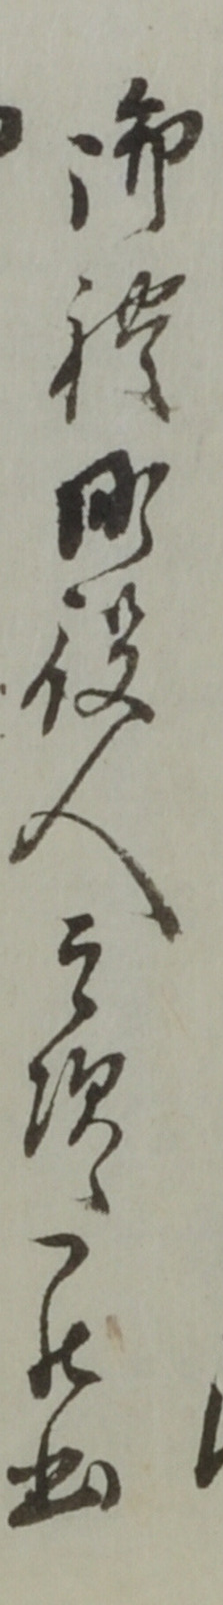御礼町役人之次ニ罷出
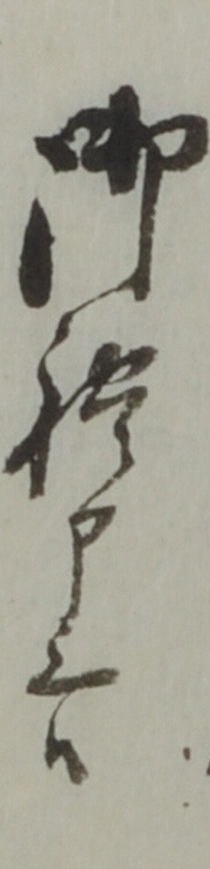御礼申上候
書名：抜書
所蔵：伊那市立高遠町図書館・合同会社AMANE
